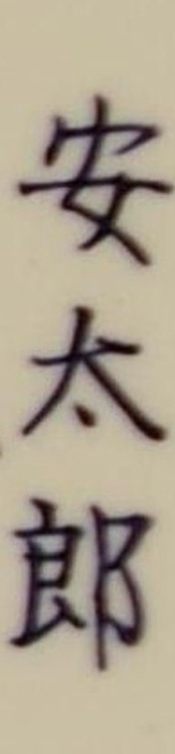安太郎
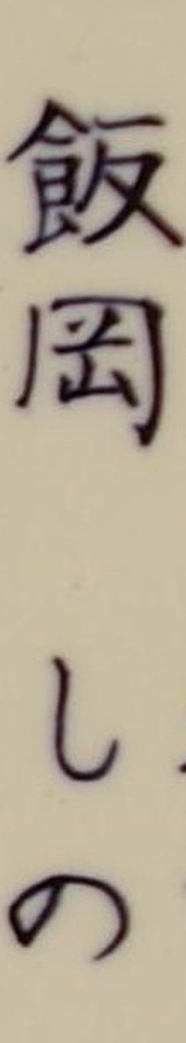飯岡しの
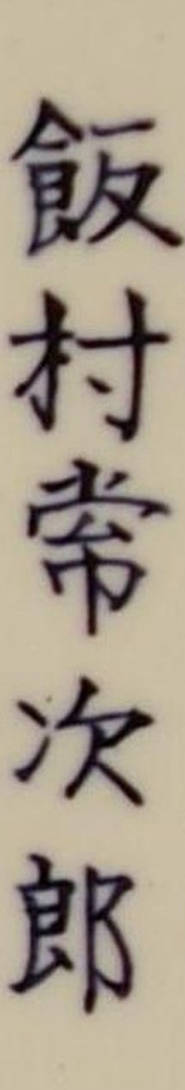飯村常次郎
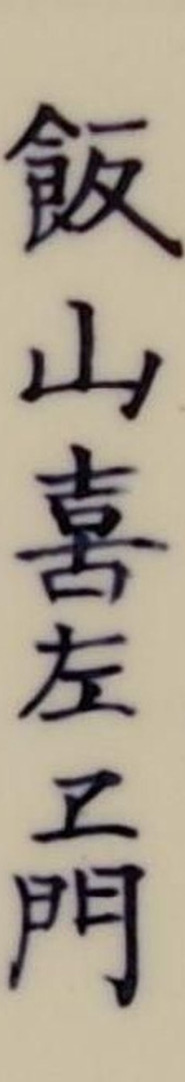飯山喜左ヱ門
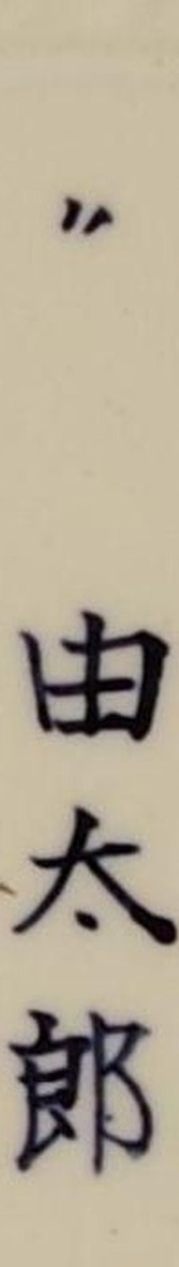由太郎
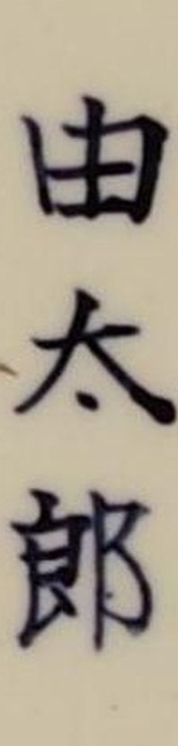由太郎
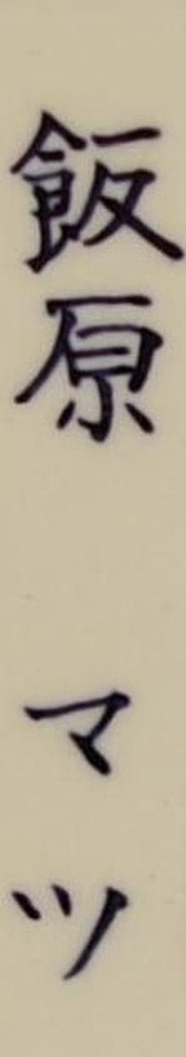飯原マツ
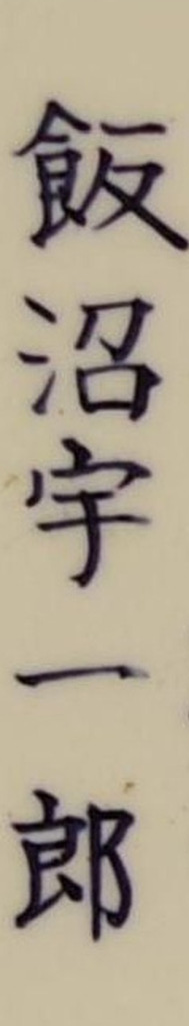飯沼宇一郎
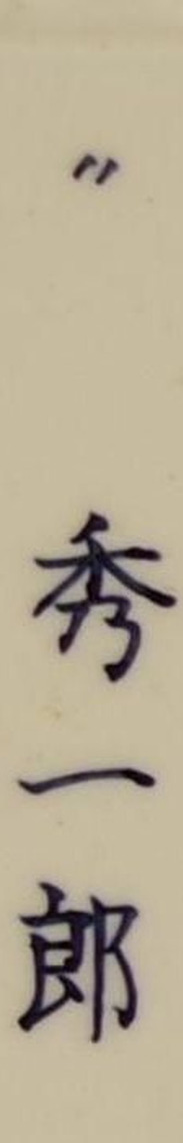秀一郎
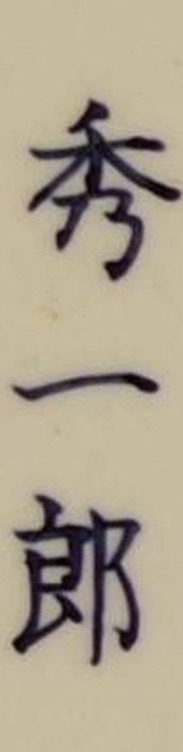秀一郎

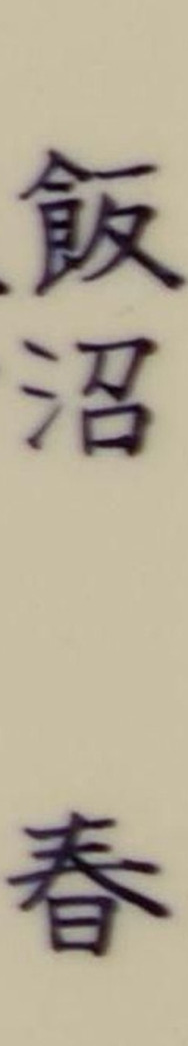飯沼春
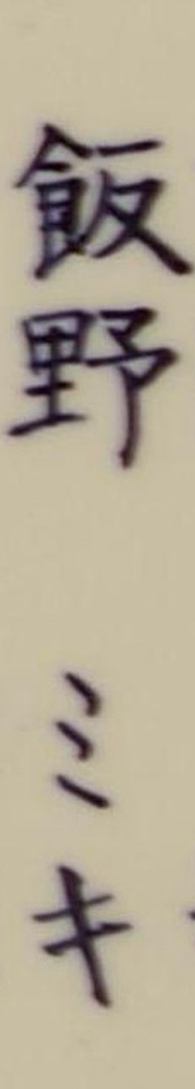飯野ミキ
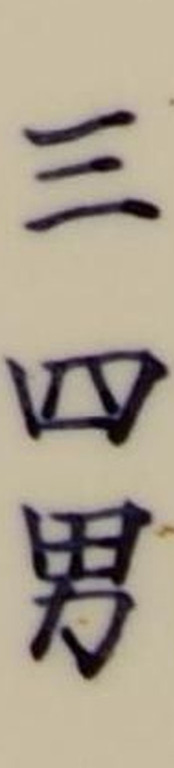三四男
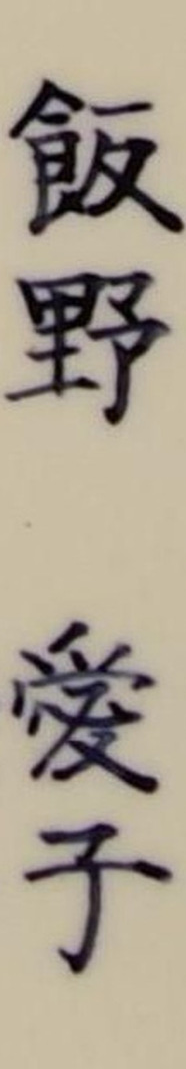飯野愛子
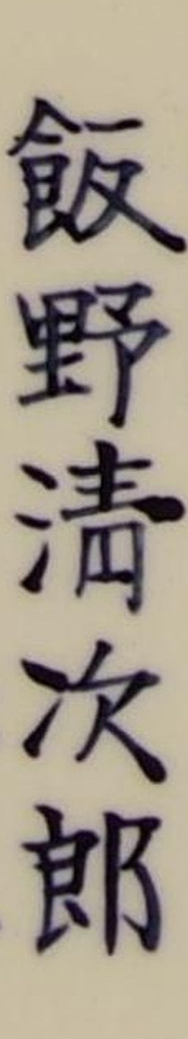飯野清次郎
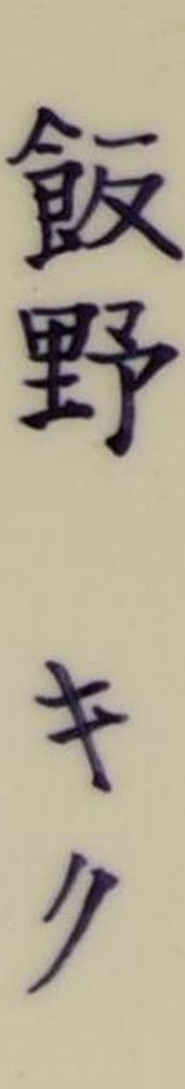飯野キク
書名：A~D
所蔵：koyasan kongobuji
